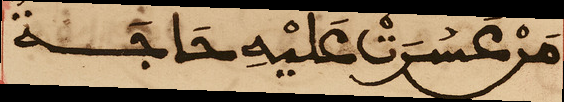من عسرت عليه حاجة
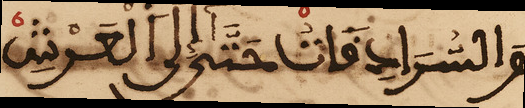و السرادقات حتى إلى العرش
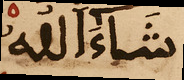شاءالله
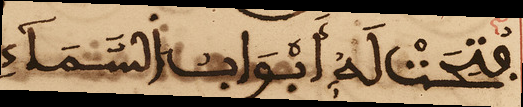فتحت له أبواب السماء
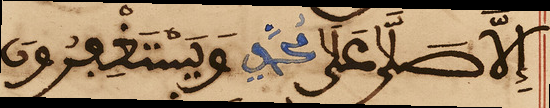الا صلى على محمد و يستغفرون
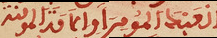# العبد المومن او
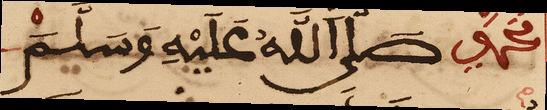محمد صلى الله عليه و سلم
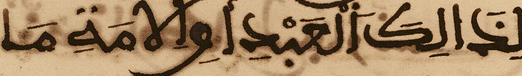لذالك العبد أ و الامة ما
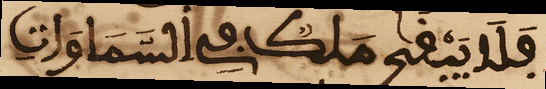فلا يبقى ملك في السماوات
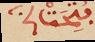# فتحت
